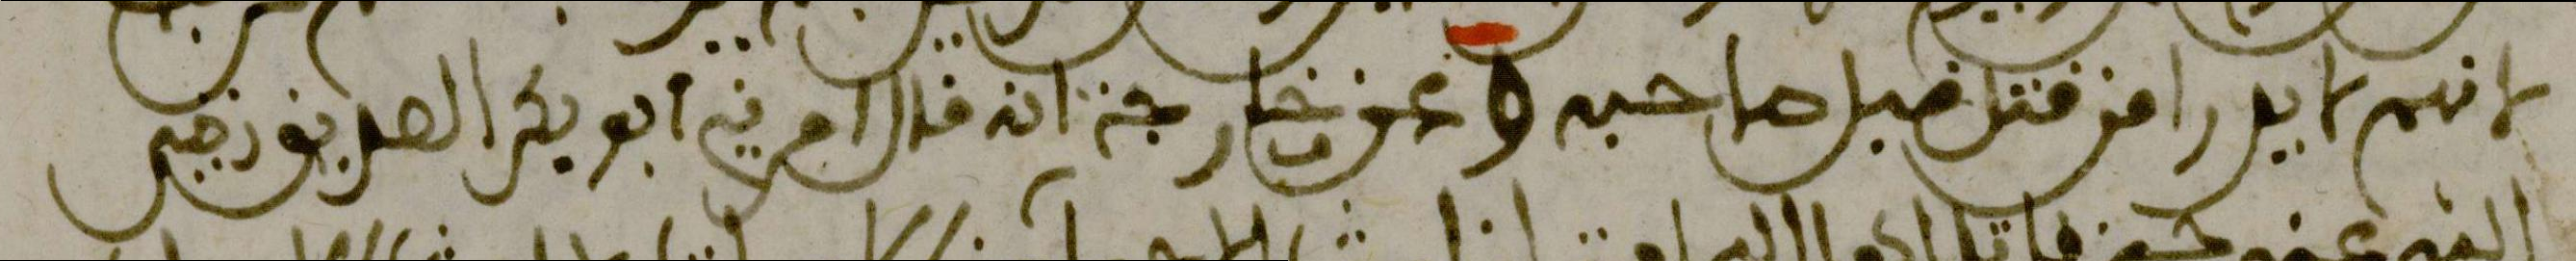لانهم لا يدرا من قتل قبل صاحبه وعن خارجة انه قال امرني ابو بكر الصديق رضي
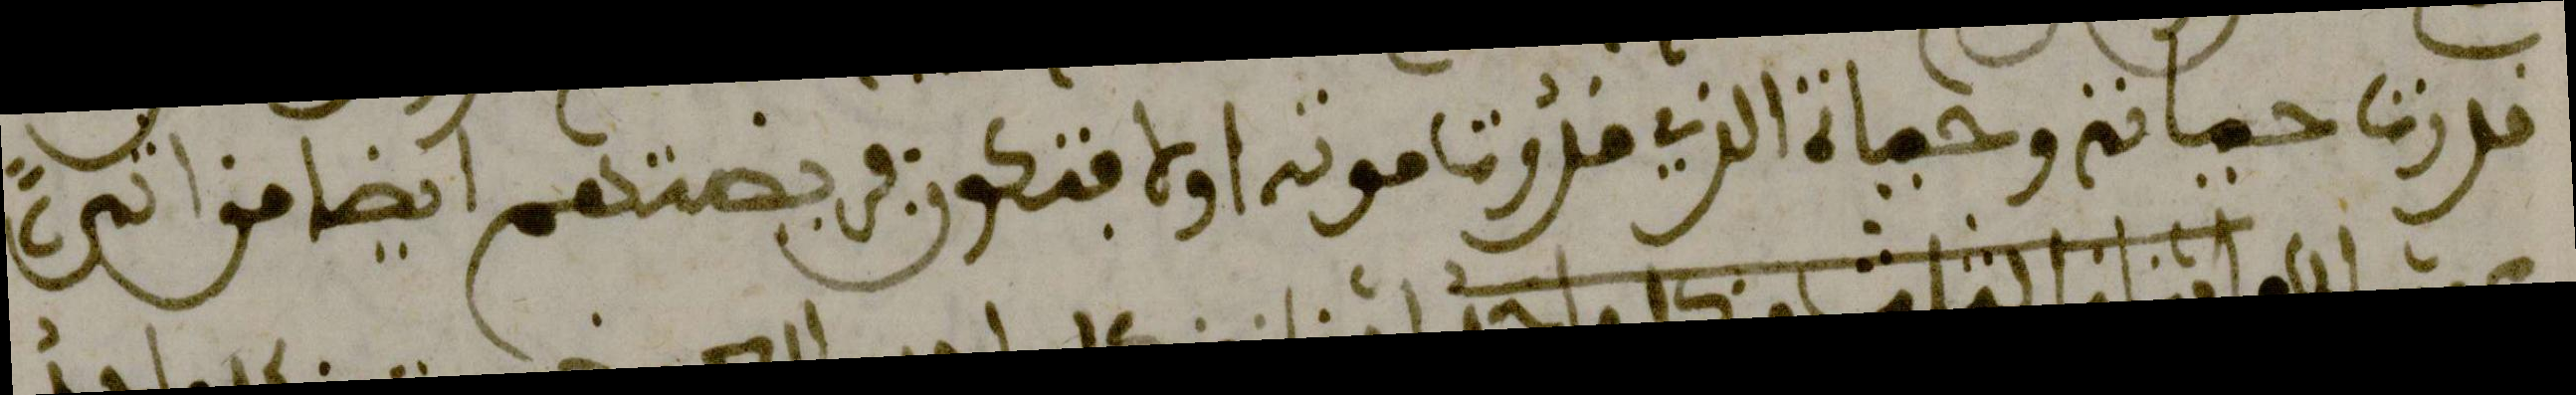قدرت حياته وحياة الذي قدرت موته اولا فتكون فريضتهم ايضا من اثنى
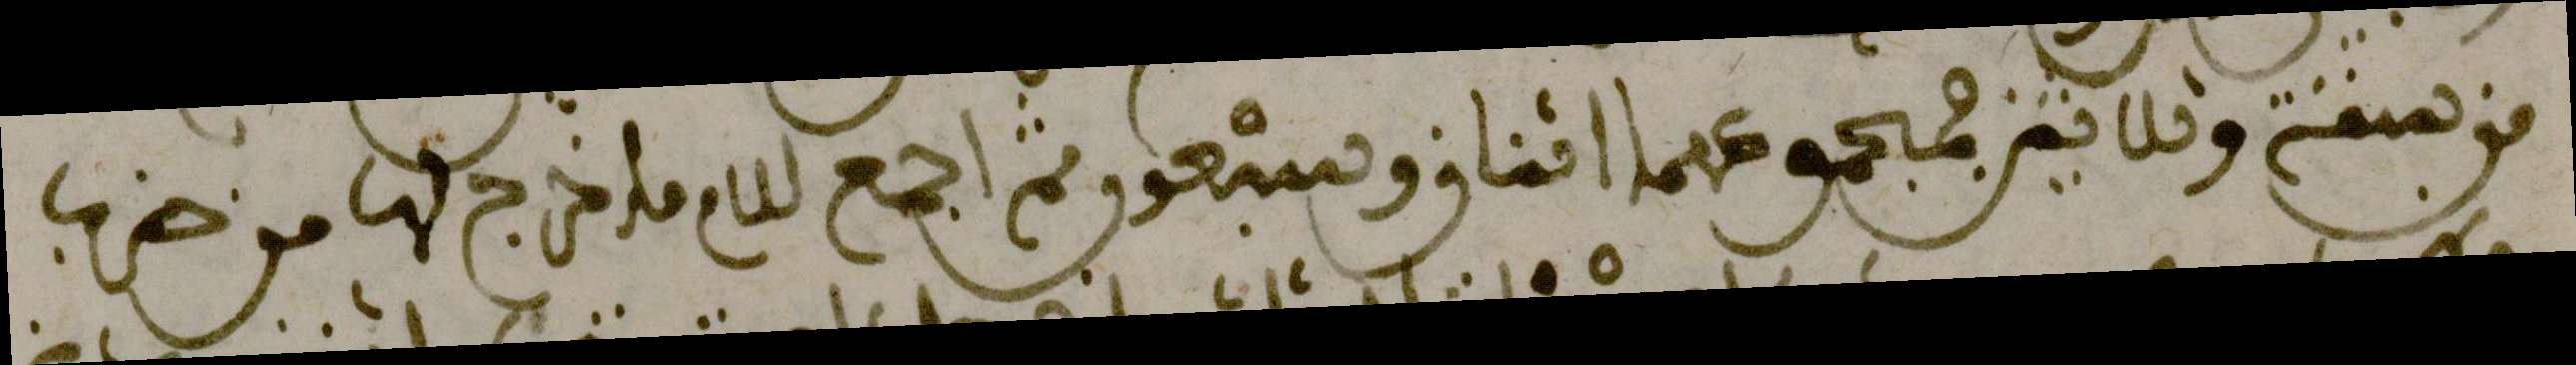من ستة وثلاثين فمجموعهما اثنان وسبعون ثم اجمع للام ماخرج لها من ضرب
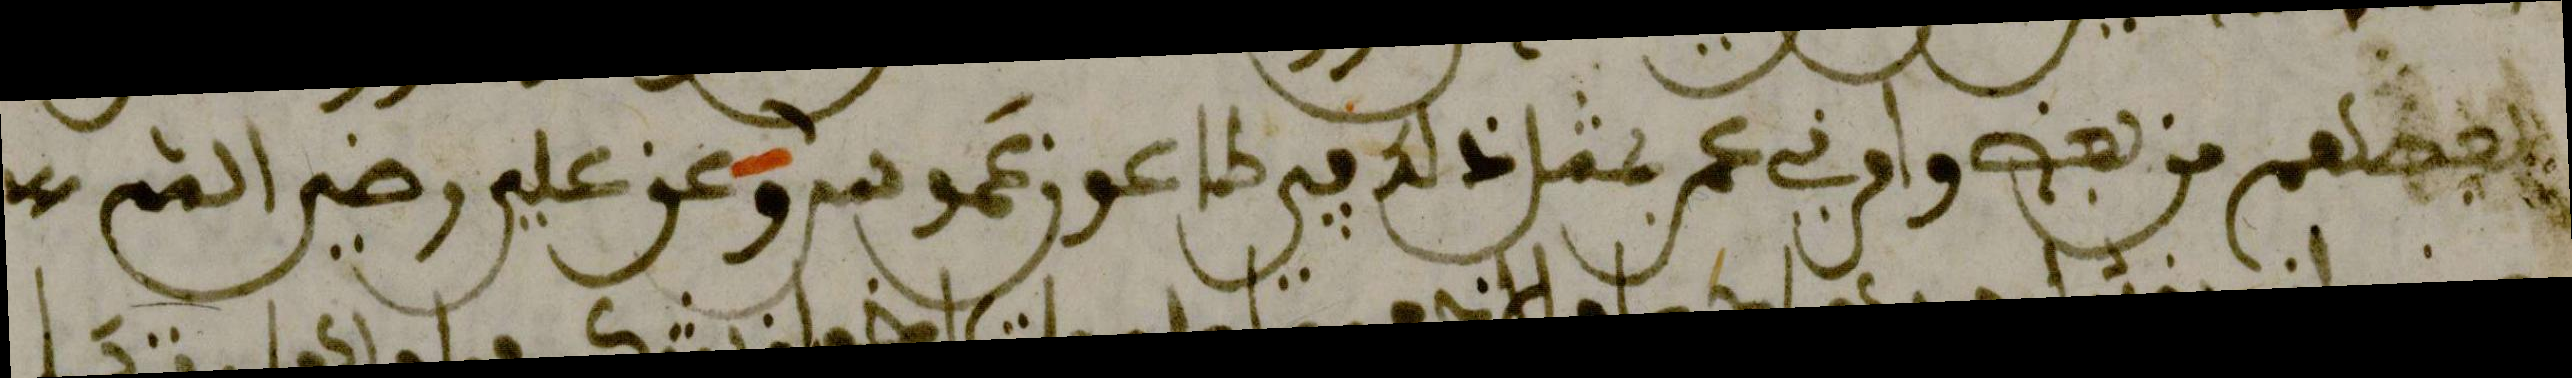بعضهم من بعض وامرني عمر بمثل ذلك في طاعون عموس وعن علي رضي الله
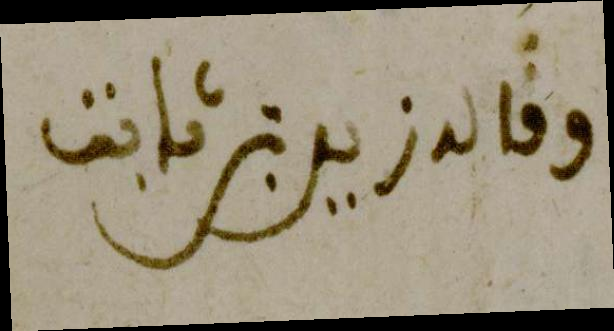وقاله زيد بن ثابت
